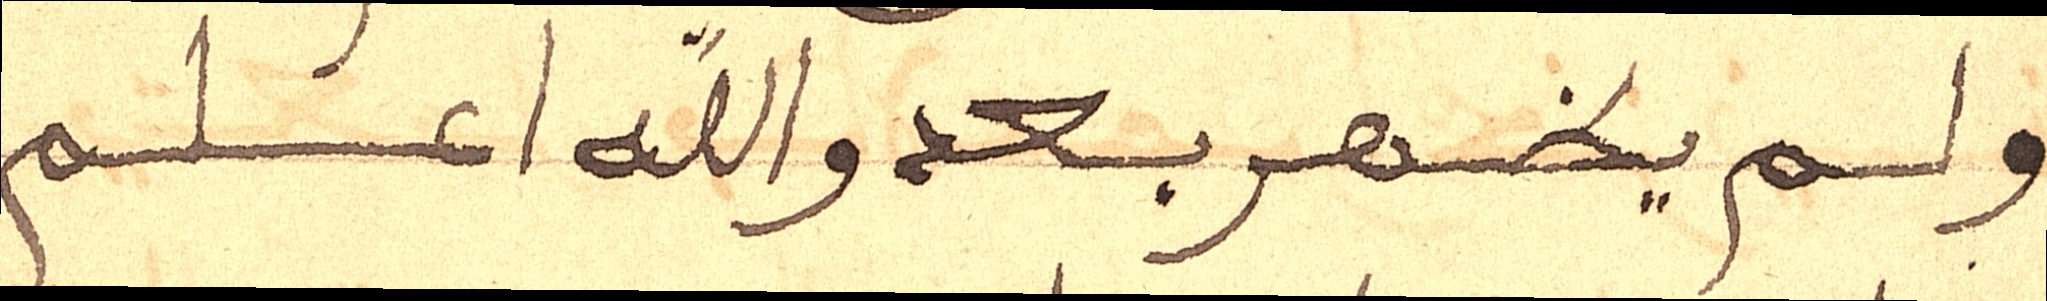ولم يظهر بعد والله اعلم
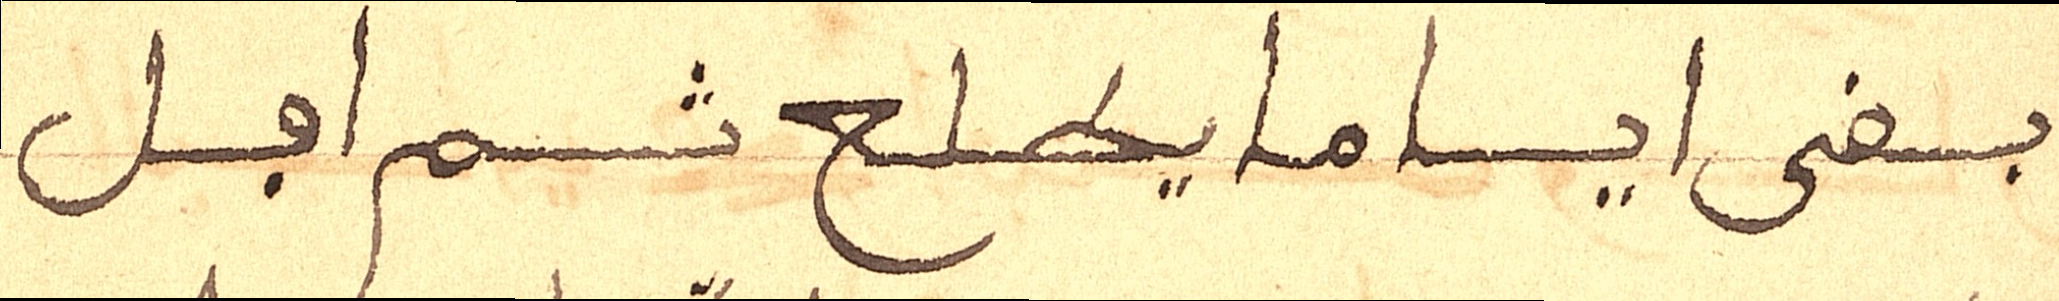بقى اياما يطلع ثم افل
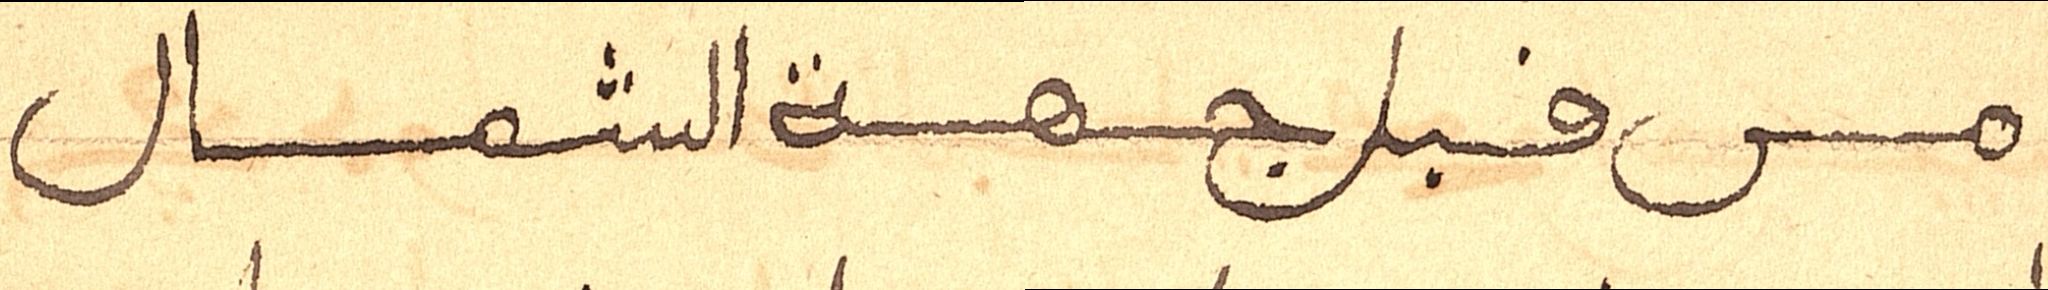من قبل جهة الشمال
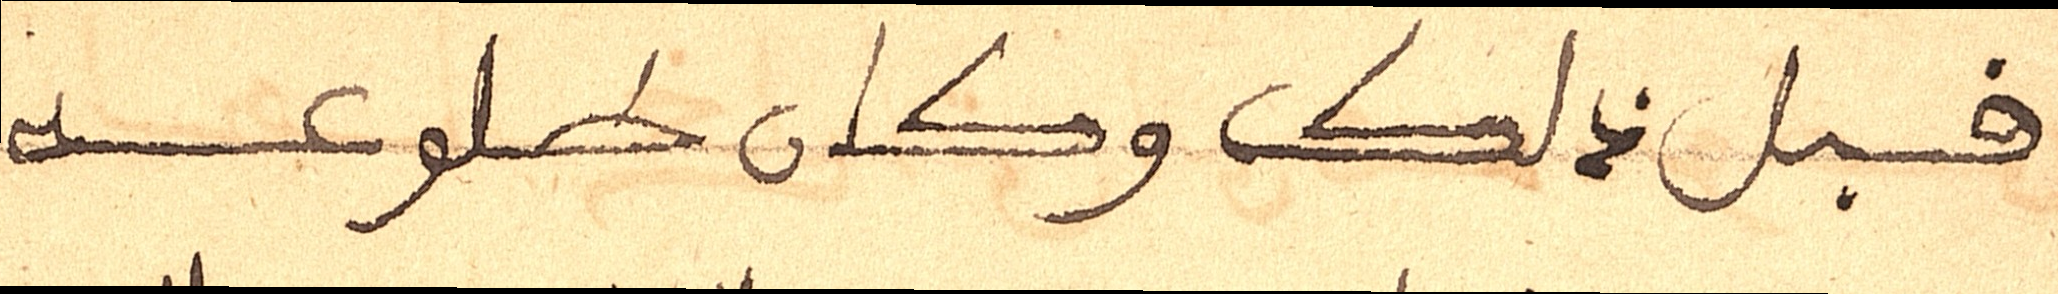قبل ذلك وكان طلوعه
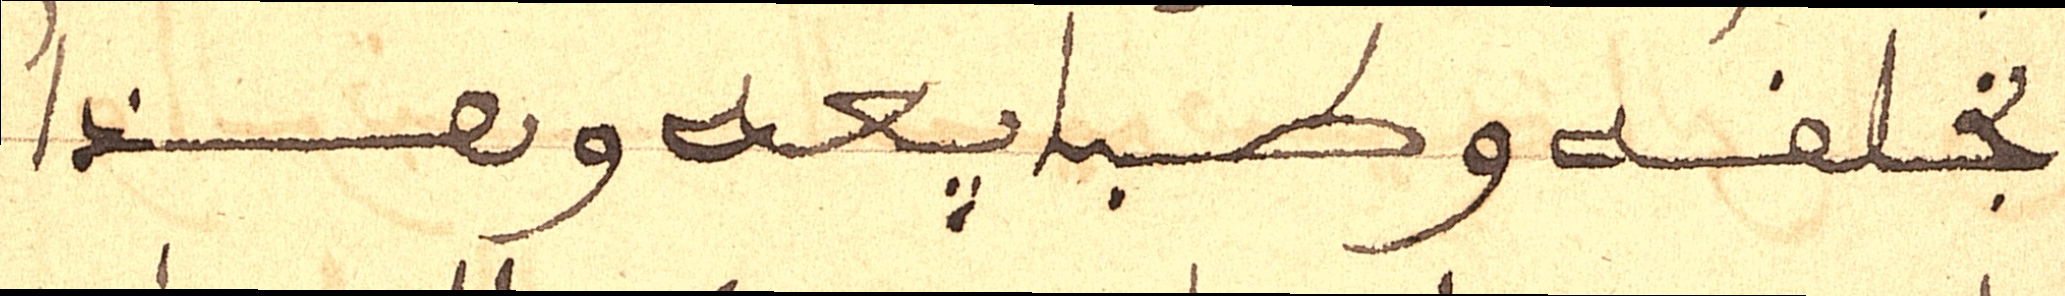بخلقه وطبائعه وهذ
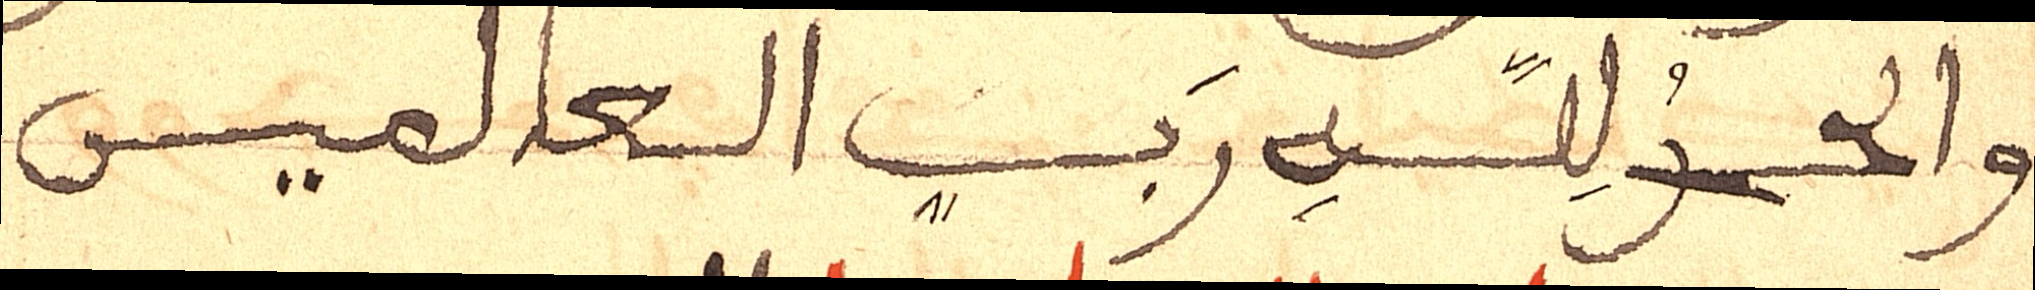والحمد لله رب العالمين
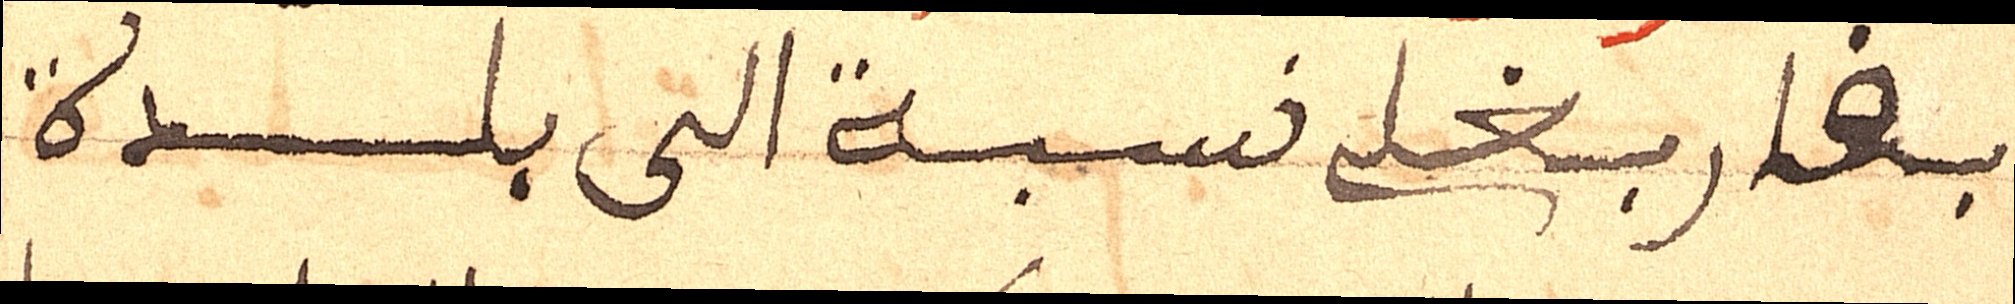بقار بغلى نسبة الى بلدة
